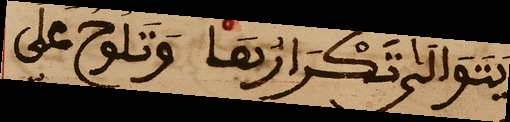يتوالى تكرارها و تلوح على
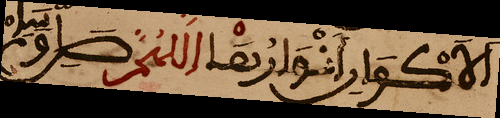الاكون أنوارها اللهم صل و سلم
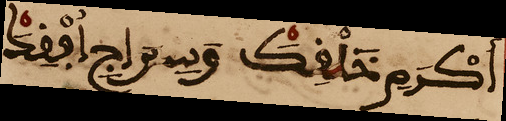أكرم خلقك و سراج افقك
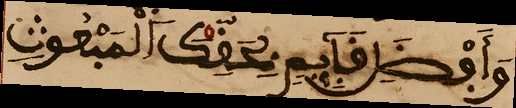و أفضل قائم بحقك المبعوث
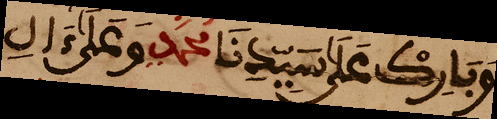و بارك على سيدنا محمد و على ءال
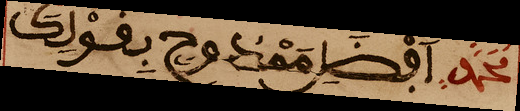محمد افضل ممدوح بقولك
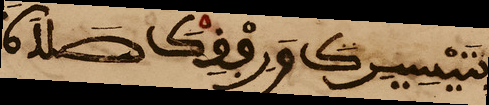بتيسيرك و رفقك صلاة
